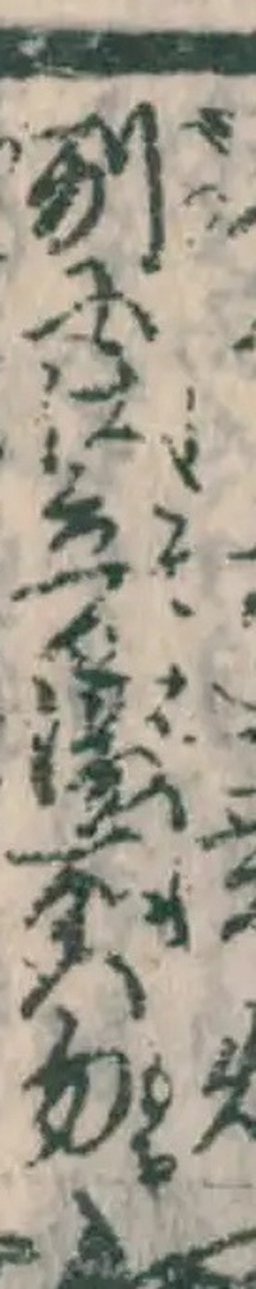別に仕立る場所は勿
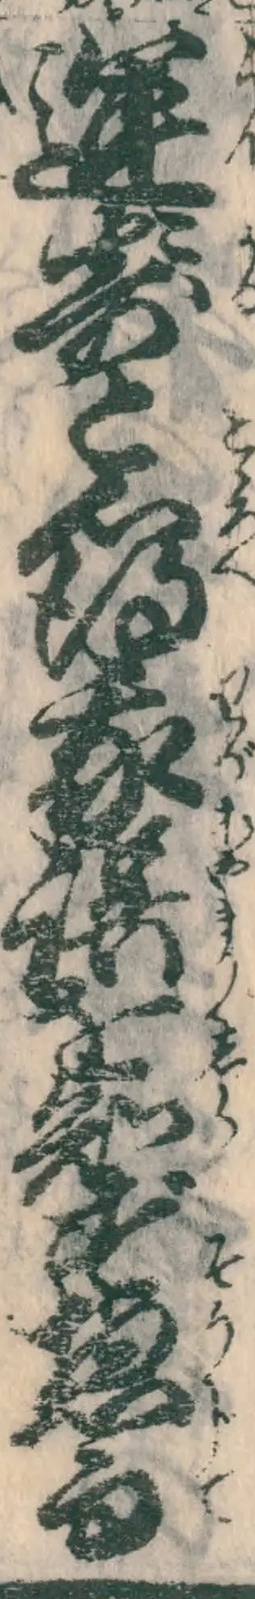運に寄と心得我誤りを知ず惣て
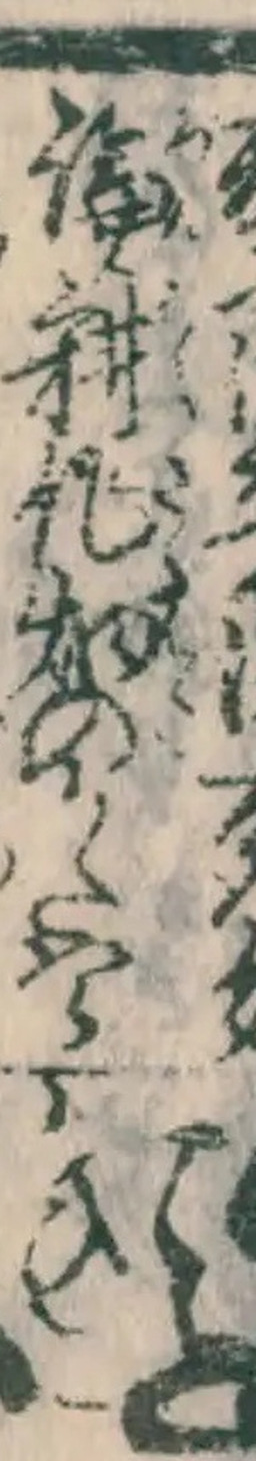論耕作畑のかたはら
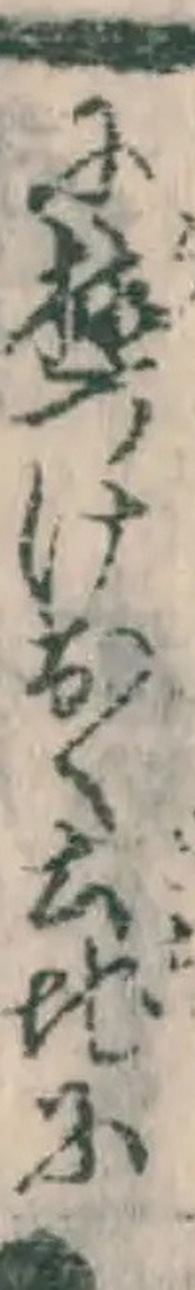に植つけおく土地に
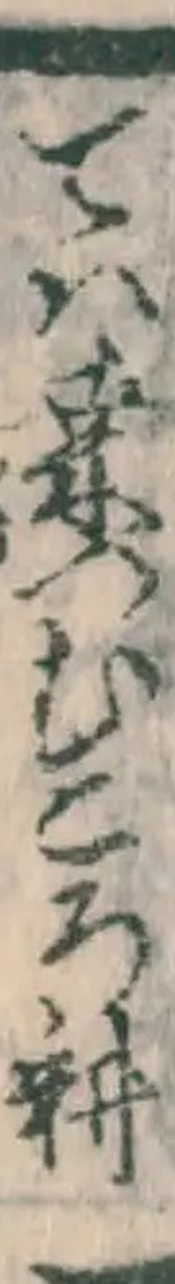ては桑つむころ耕
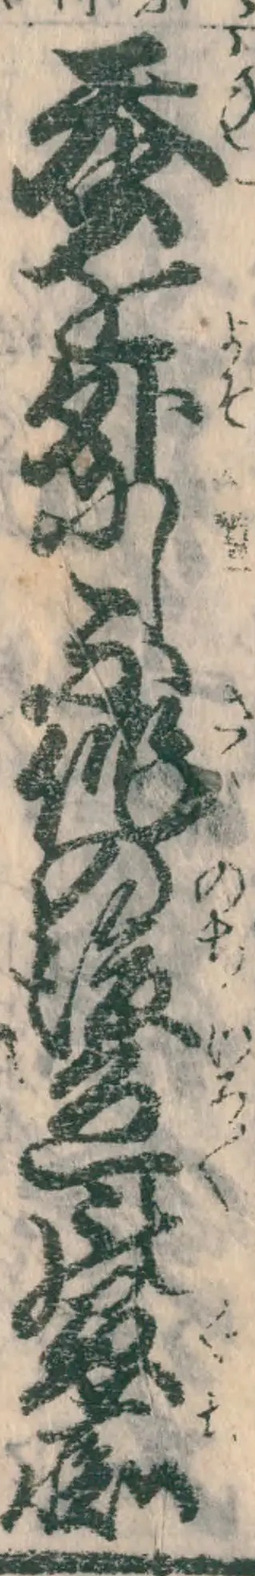蚕を外にし不作の後色々の愚痴
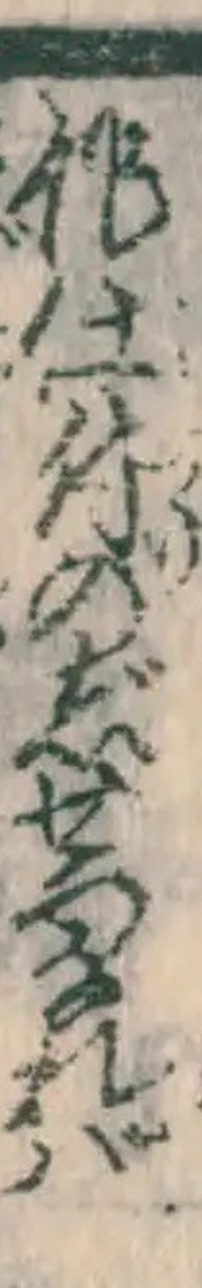作仕付のじせつなれば
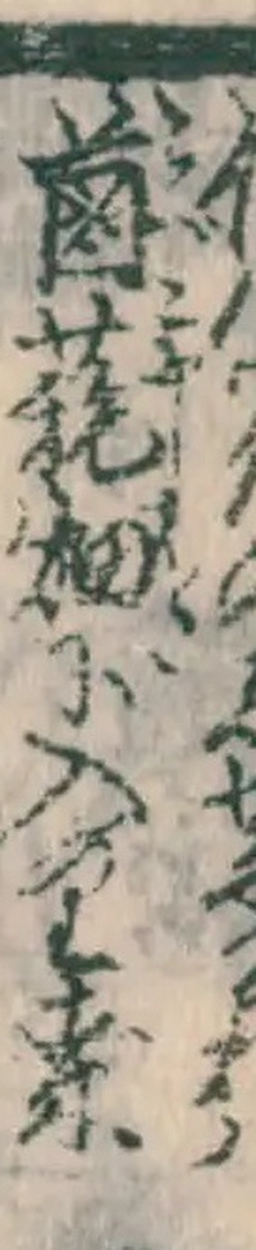菌畑に入り桑
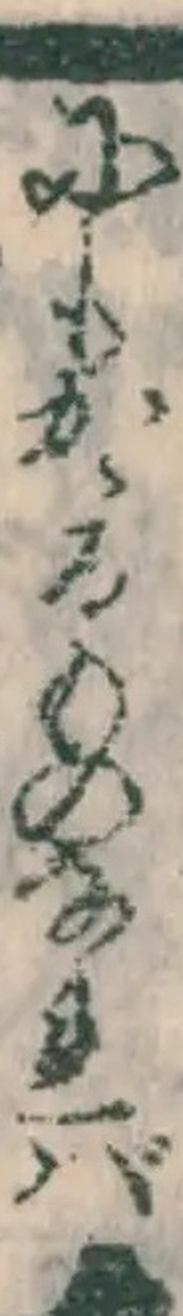にもかゝるものなれば
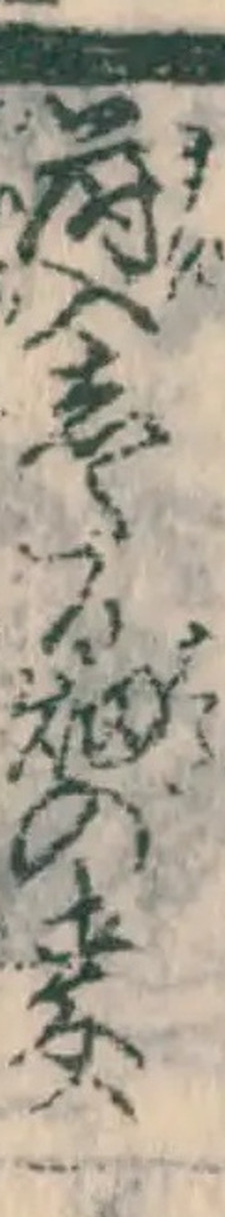蒔入したる畑の桑は
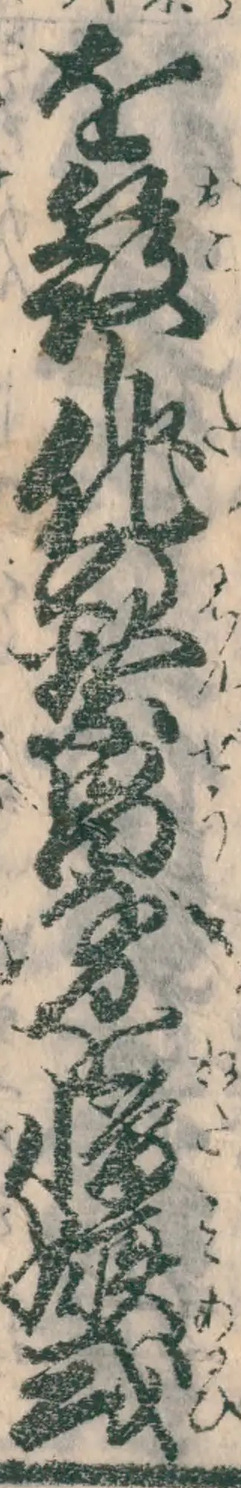を発し他の繁昌なるを憎嫉或
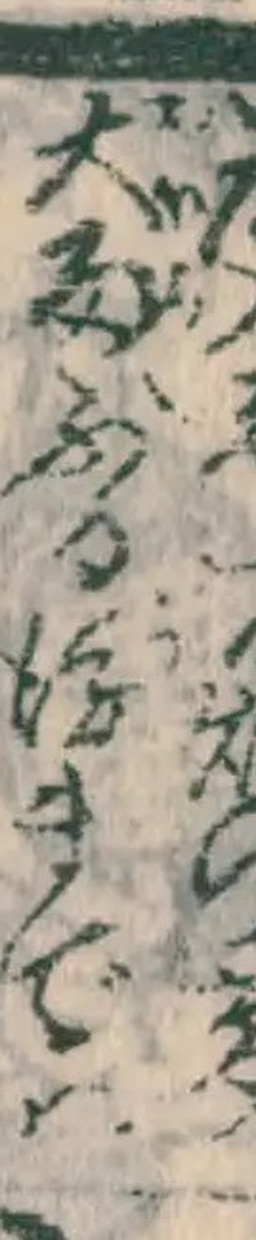大雨ふる後までは
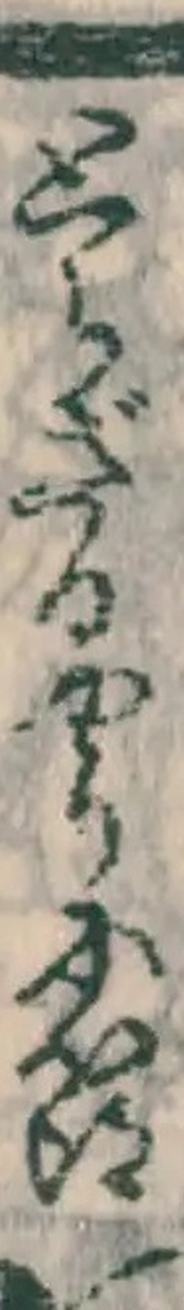とらざるやうに心得
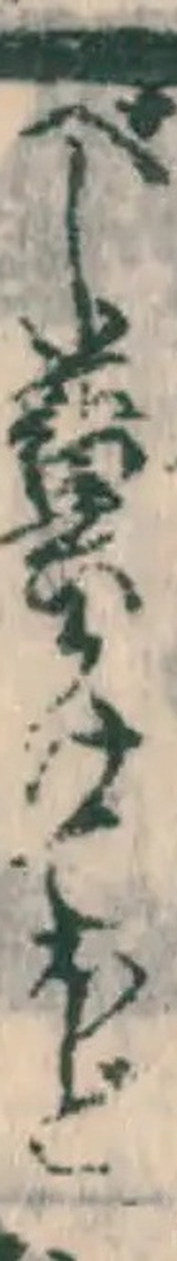べし糞かけてほど
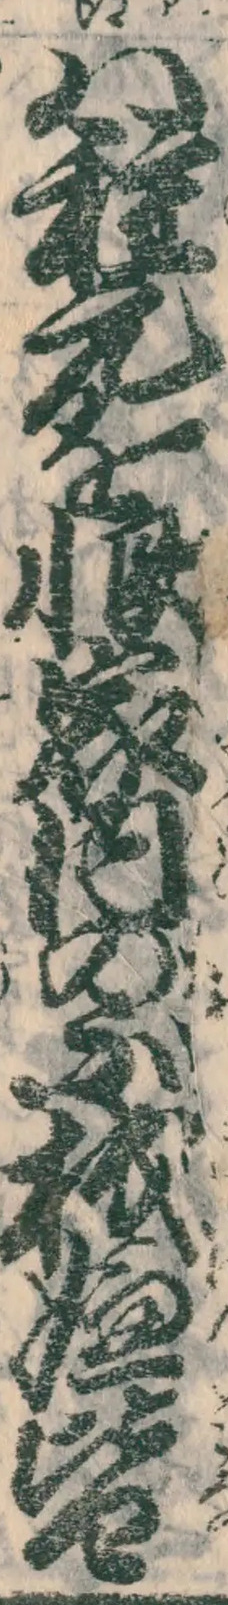は種元を恨家内の不機嫌皆
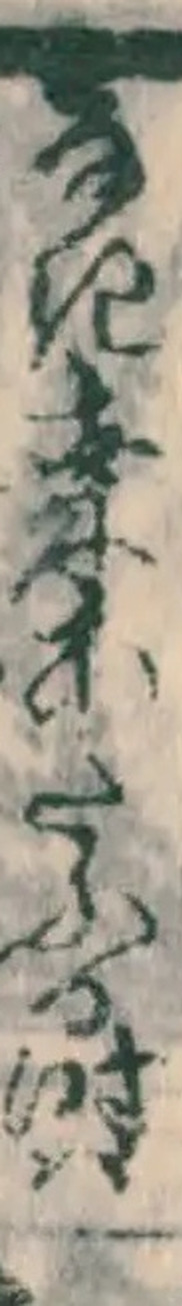なき桑あたふる時は
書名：養蚕往来
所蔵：国立国会図書館 National Diet Library, JAPAN
